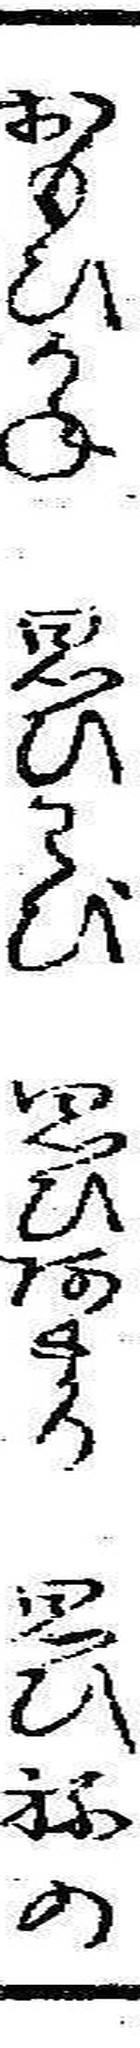おもひかね思ひわび思ひあまり思ひねの
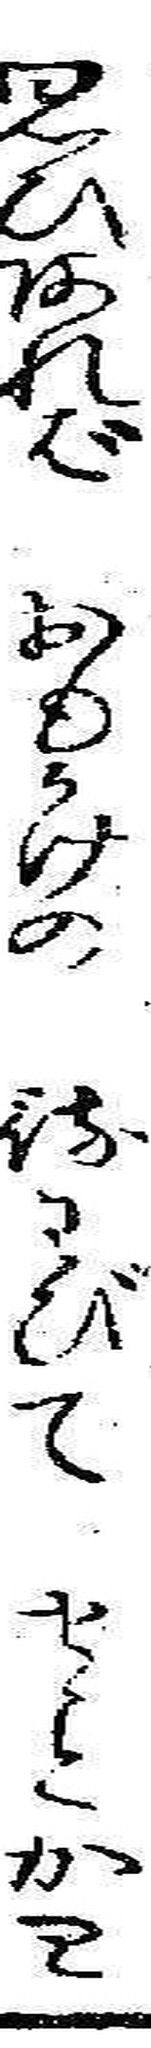思ひあればおもかけの待わびてせとこかり
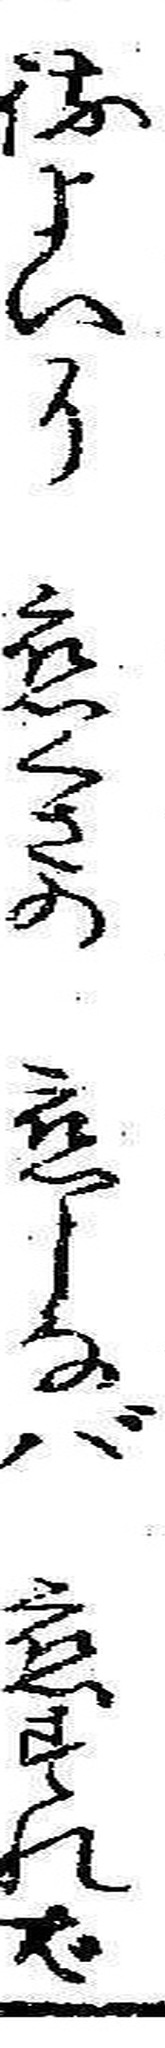待よいに恋くさの恋しなば恋すれば
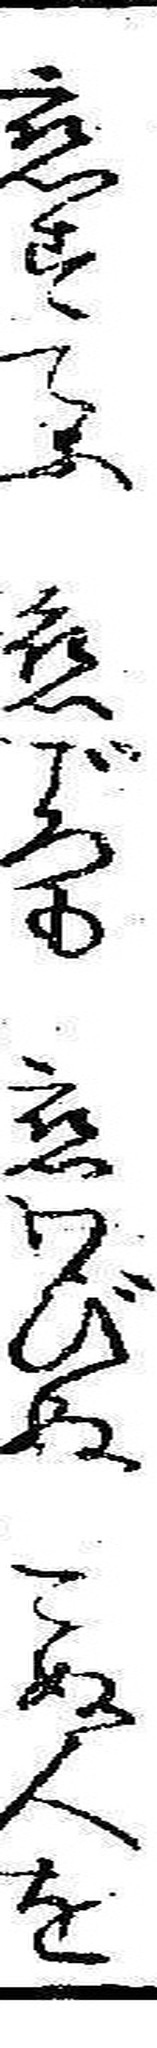恋すてふ恋ごろも恋わびぬこぬ人を
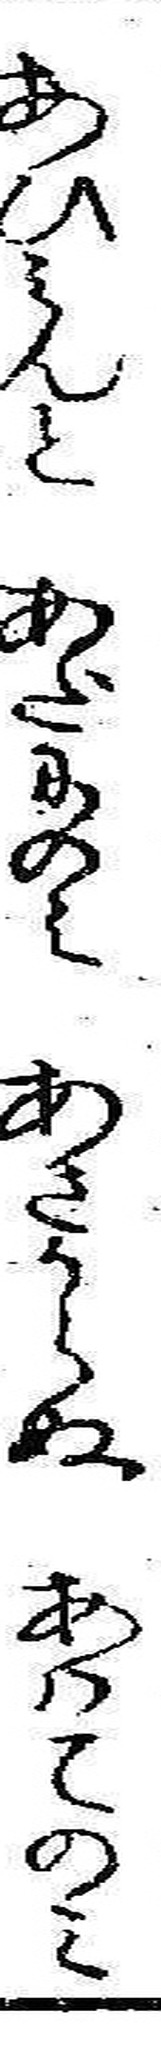あひみんとあだにのみあさらかぬあはてのみ
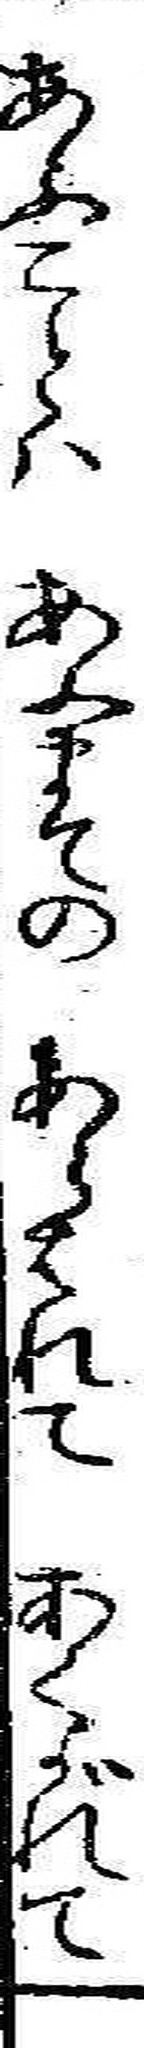あふことはあふまてのあらはれてあくれて
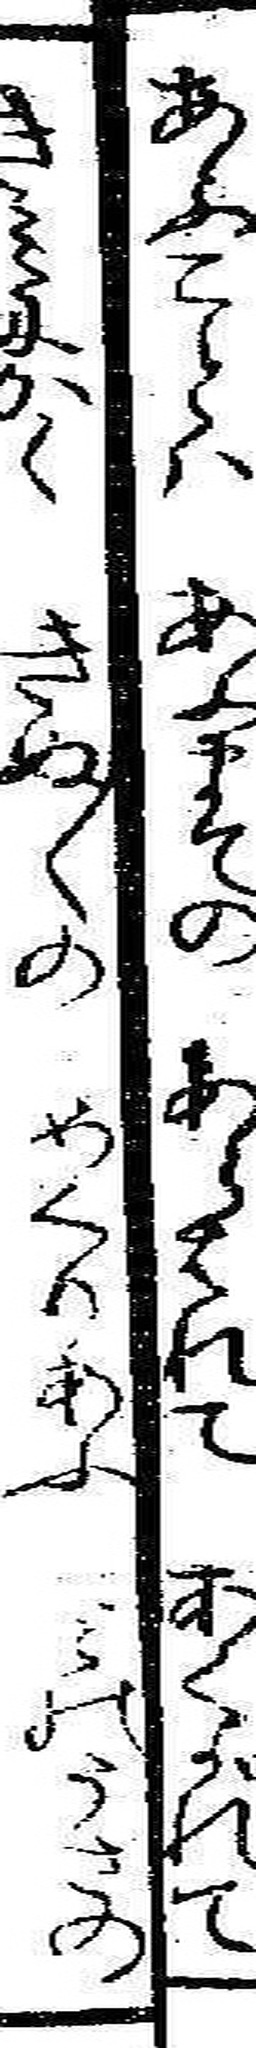きみにかくきぬ〳〵のめくりあふみのうさの
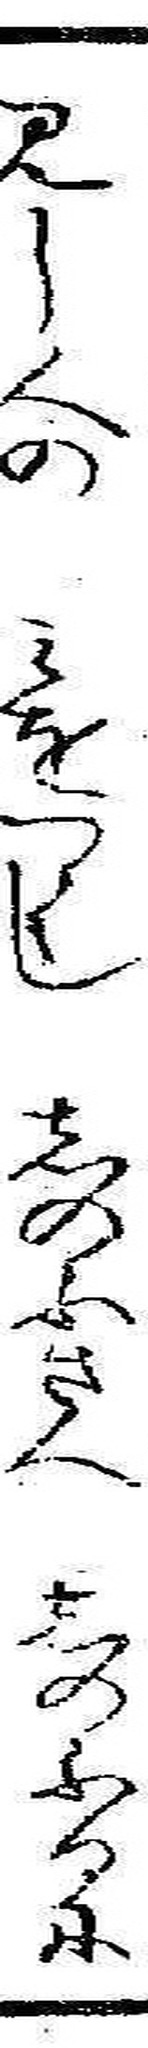見し人のみをつくししのふさへしのふるに
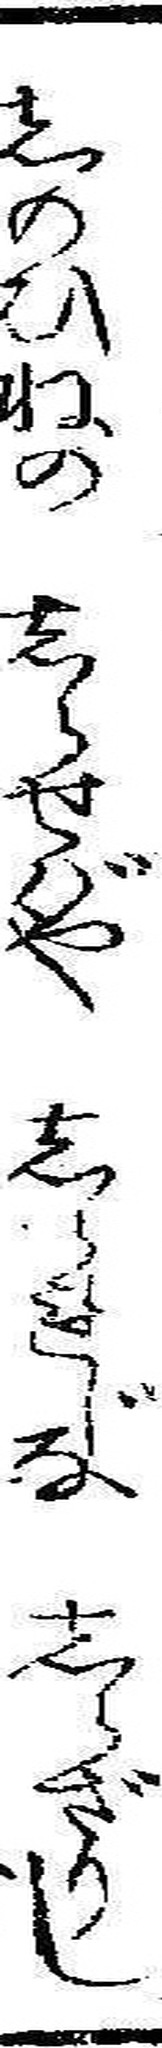しのひねのしらせばやしられじなしらざりし
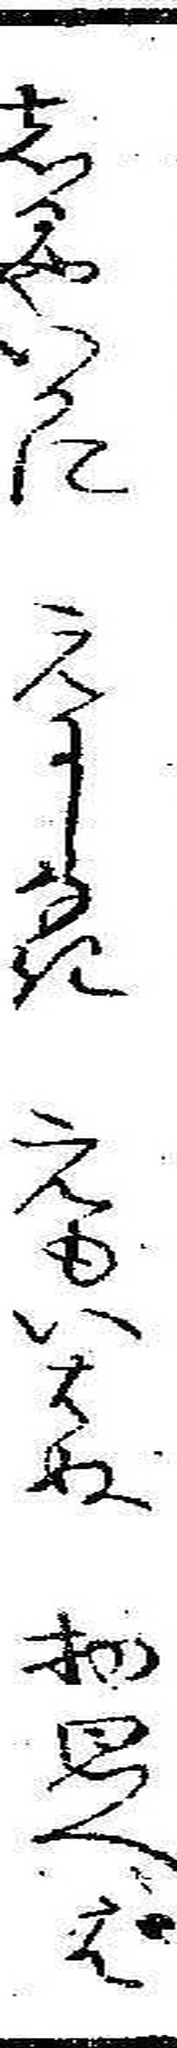しるやいかにえにしなきえもいはぬ物思へば
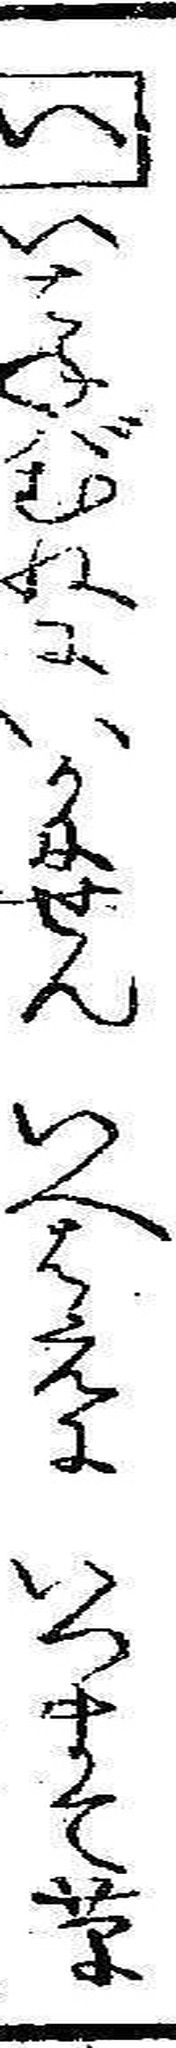いいはねばむねにいかにせんいへはえにいつまて草
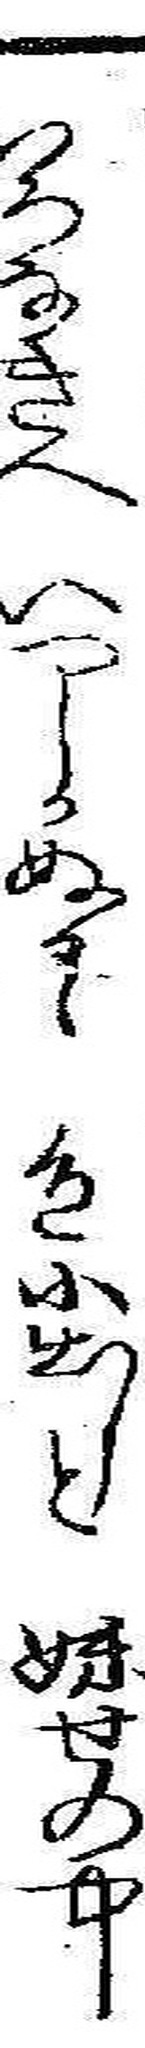いろなき人いつしかぬし色に出と妹せの中
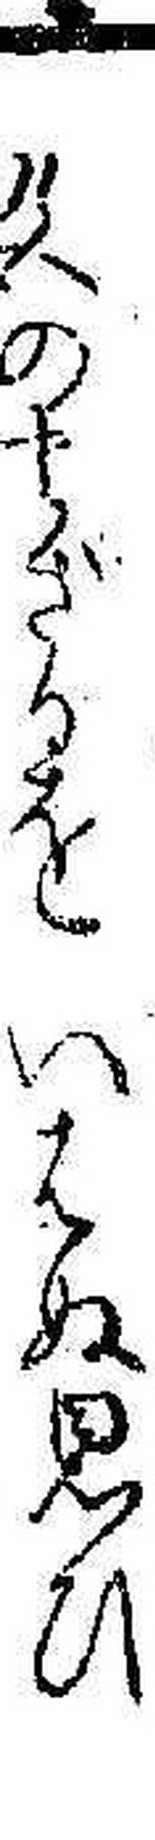色のりぎりをいはぬ思ひ
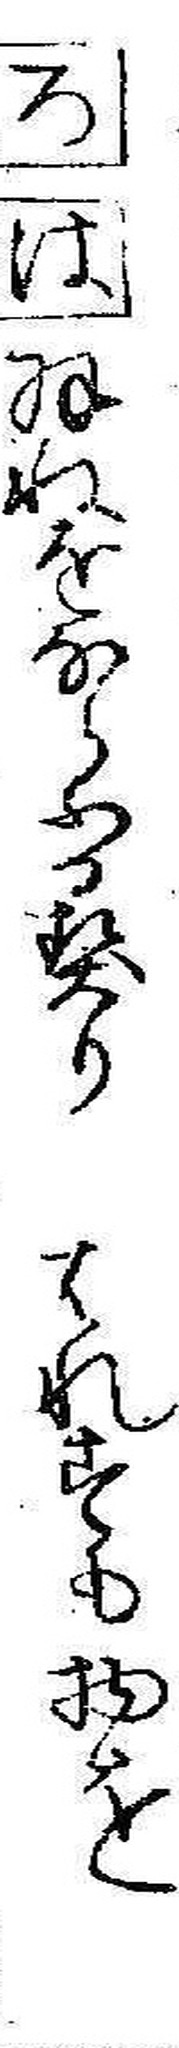ろは羽をならふる契りはれすも物を

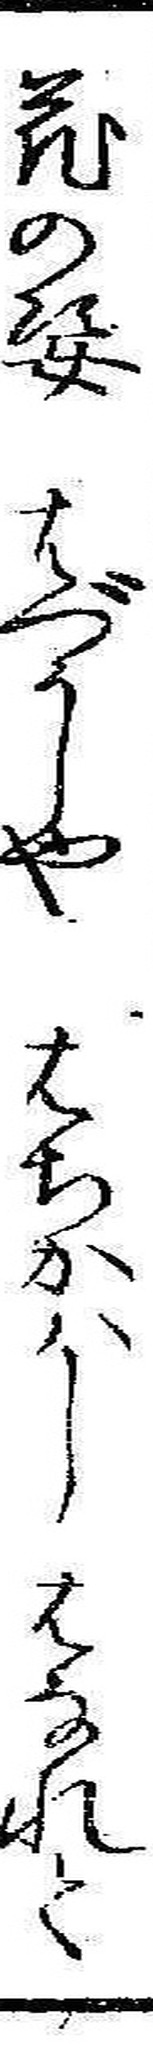花の姿はづかしやはちかはしはなれて
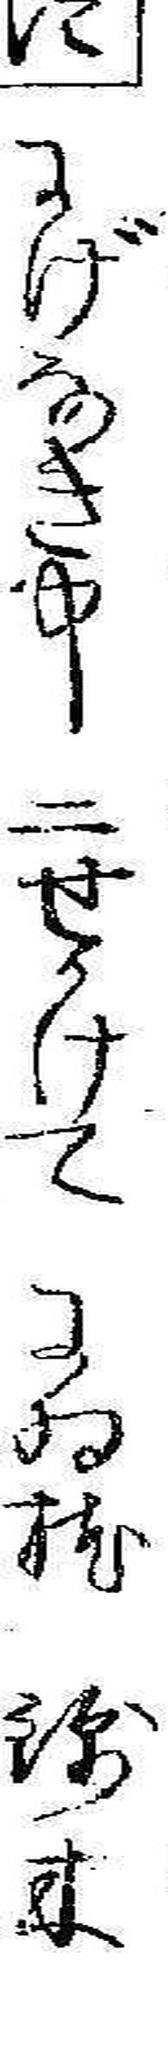ににげなき中にせかけてにゐ枕錦木
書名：狂哥はまのきさご
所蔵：国文学研究資料館
